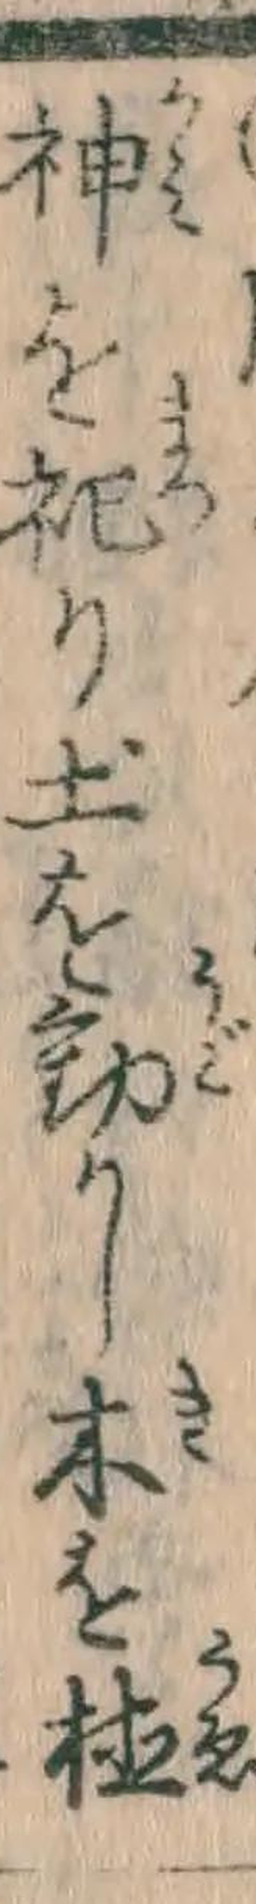神を祀り土を動かし木を植
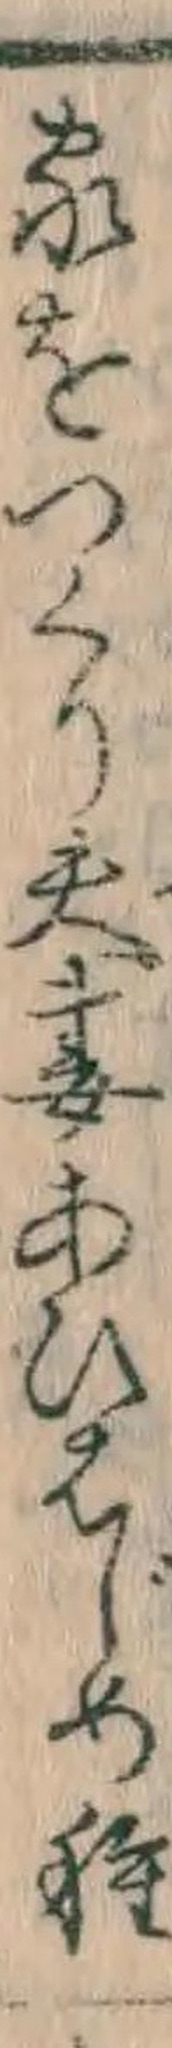家をつくり夫妻あひはじめ種
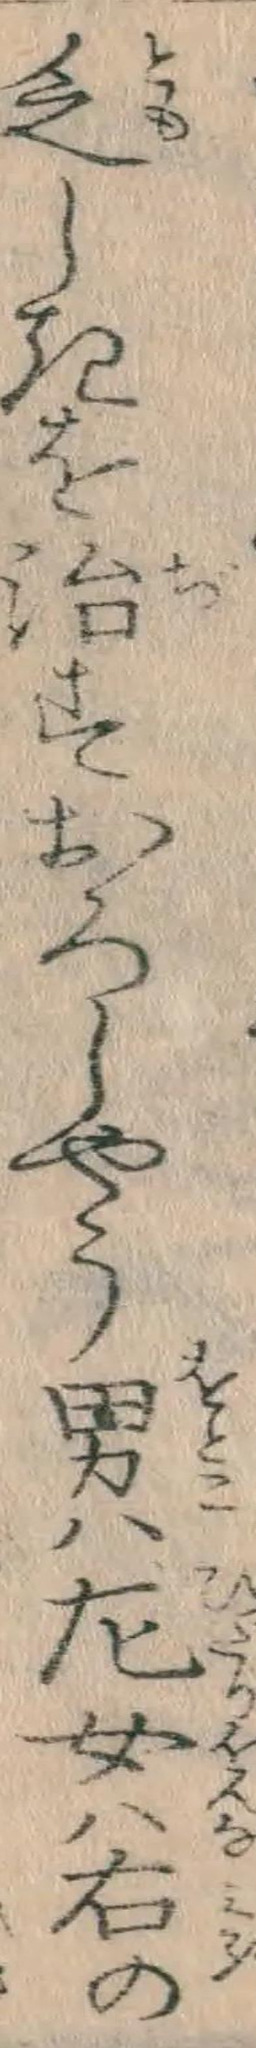乏しきを治すおろしやう男は左女は右の
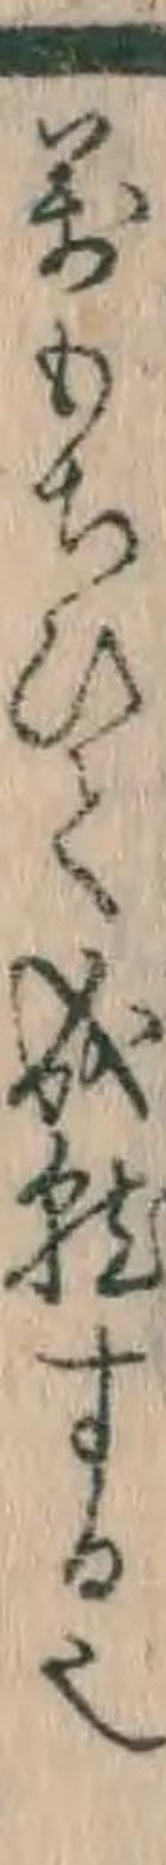万もちひて成就する也
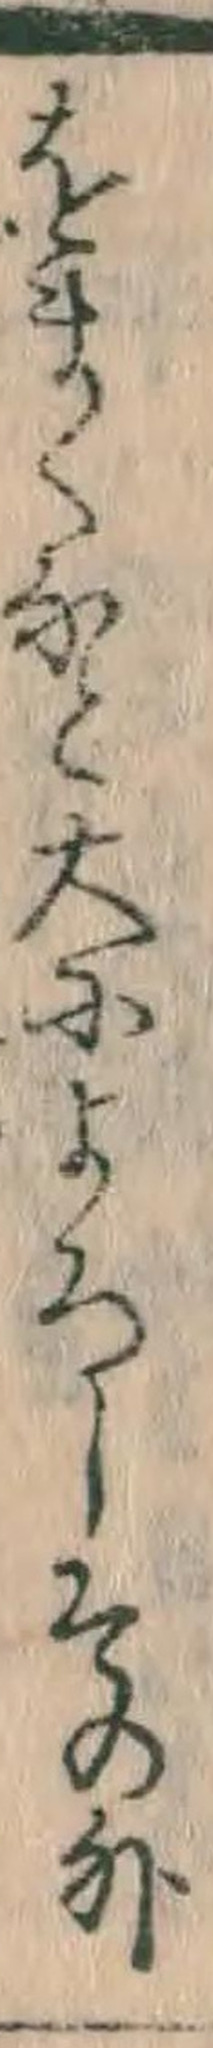をまくなと大によろしその外
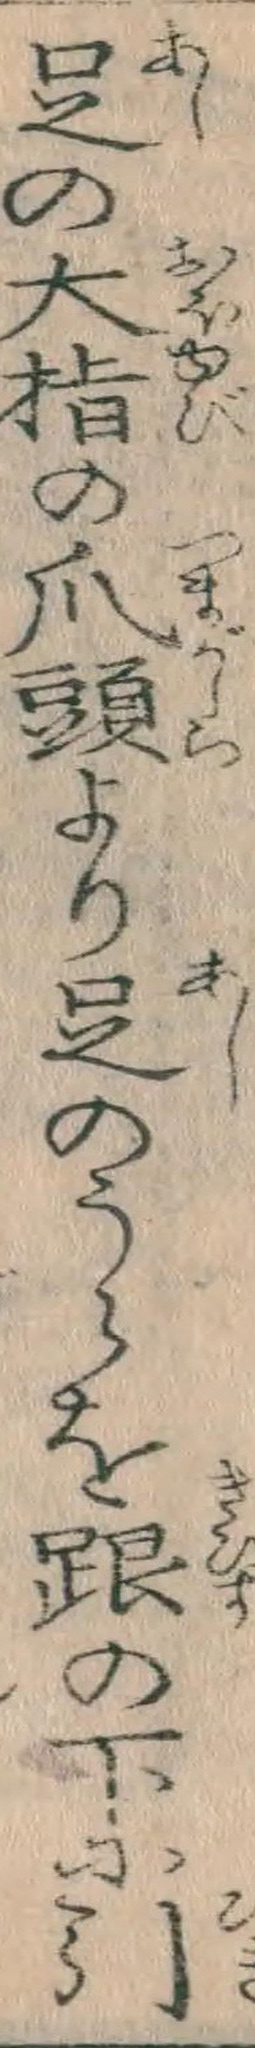足の大指の爪頭より足のうらを跟の下に引
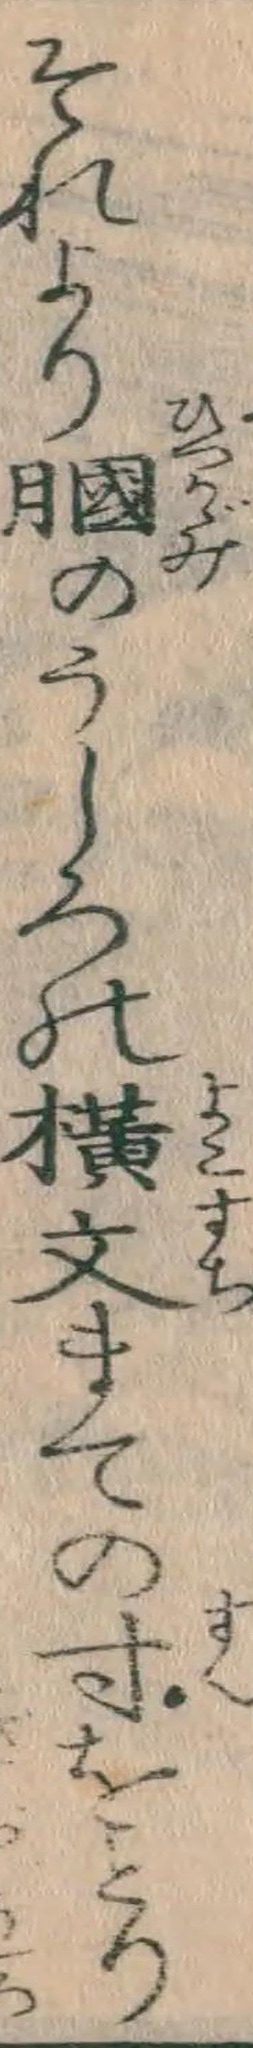それより膕のうしろの横文まての寸をとり
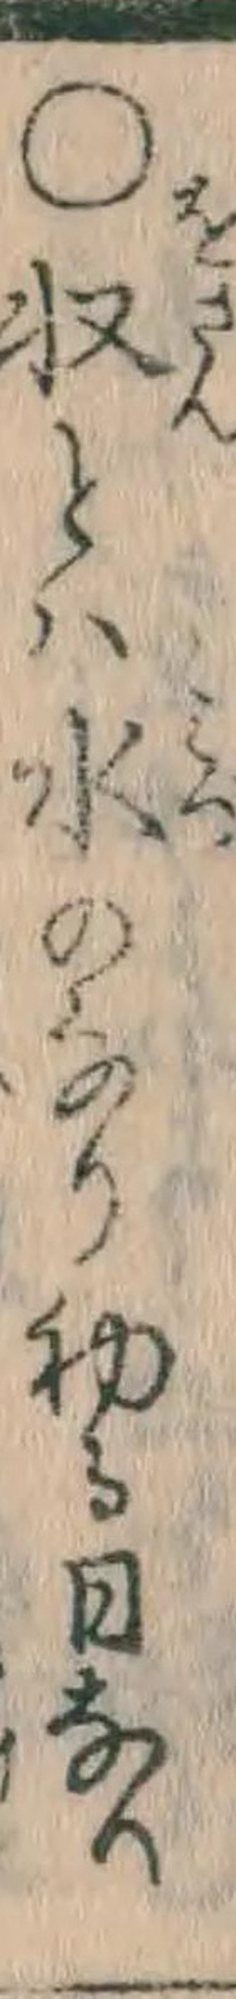○収とは水のなり初る日なり
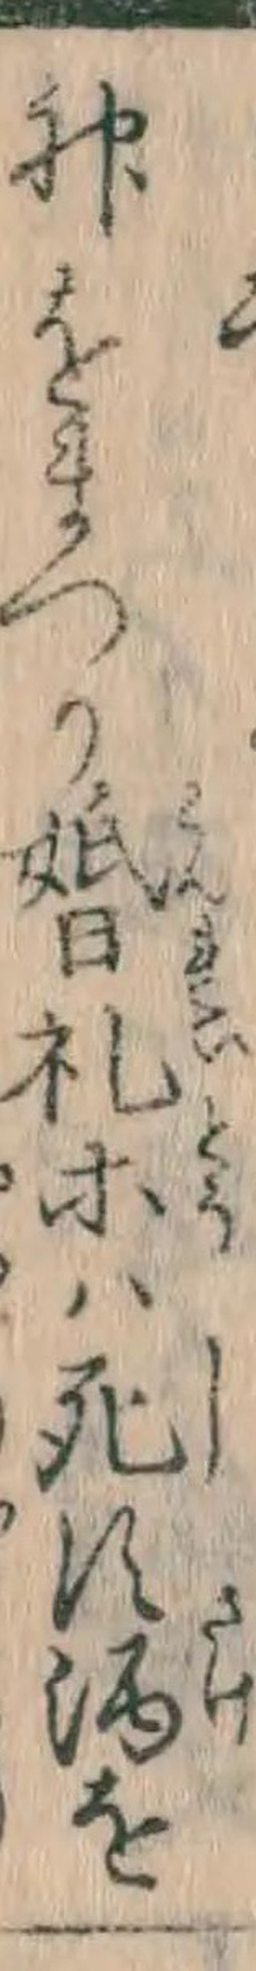神をまつり婚礼等は死す酒を
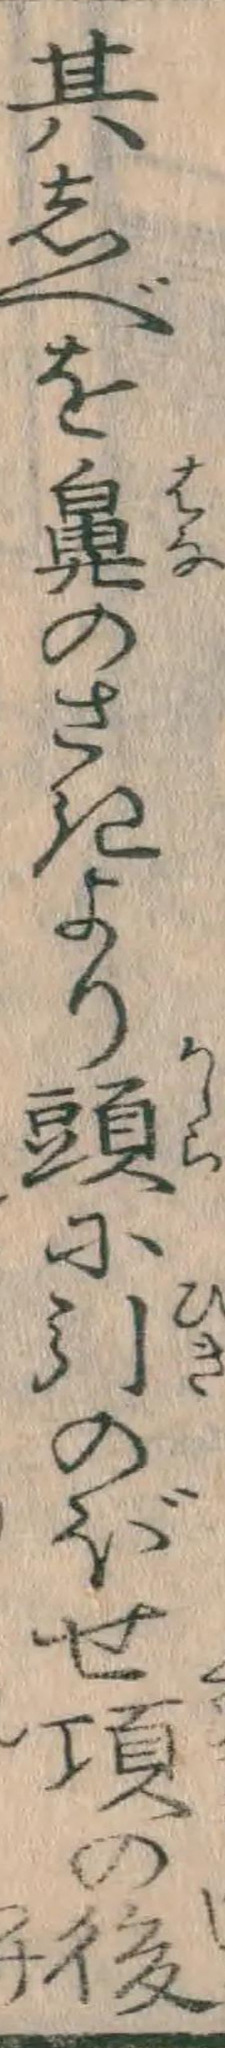其しべを鼻のさきより頭に引のぼせ項の後
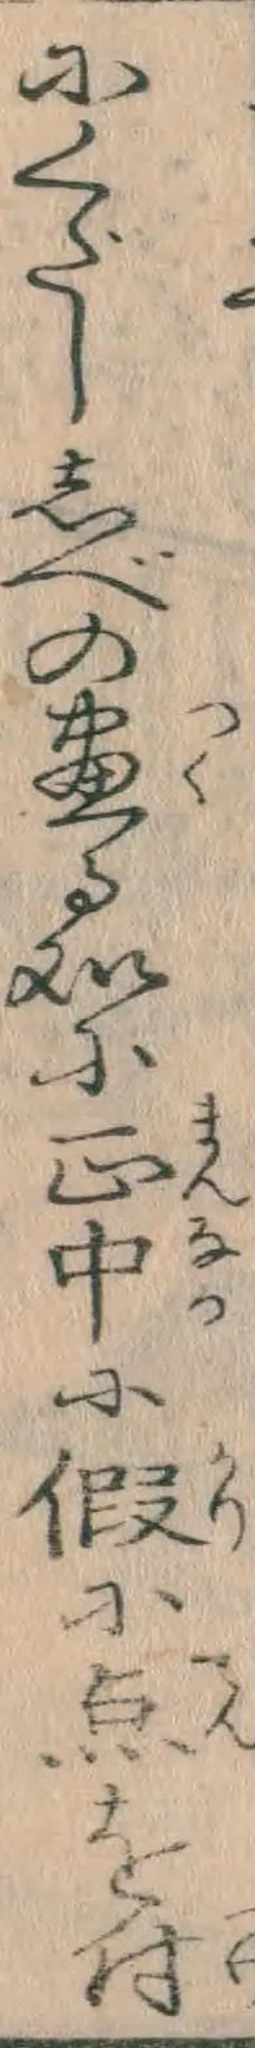にくだししべの尽る処に正中に仮に点を付
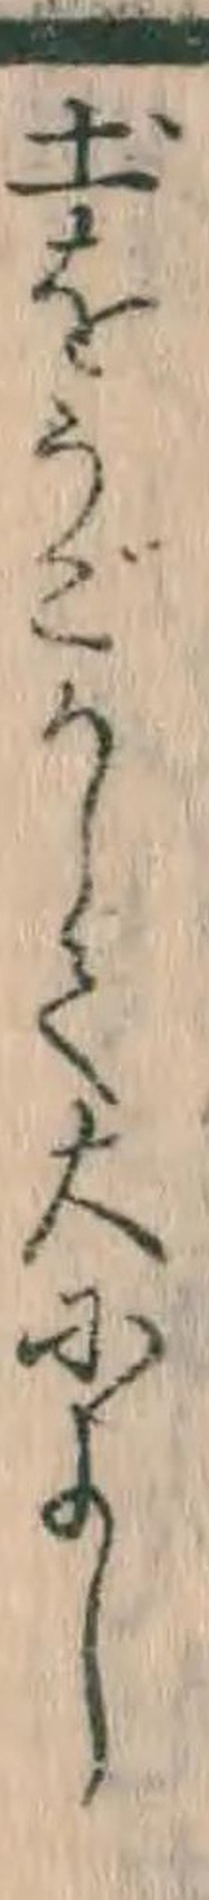土をうごかして大によし
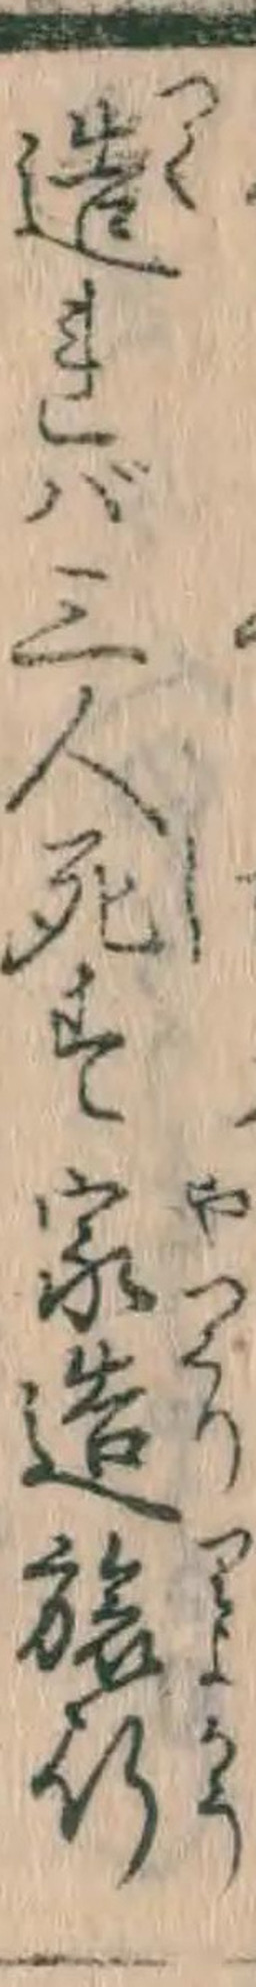造れば三人死す家造旅行
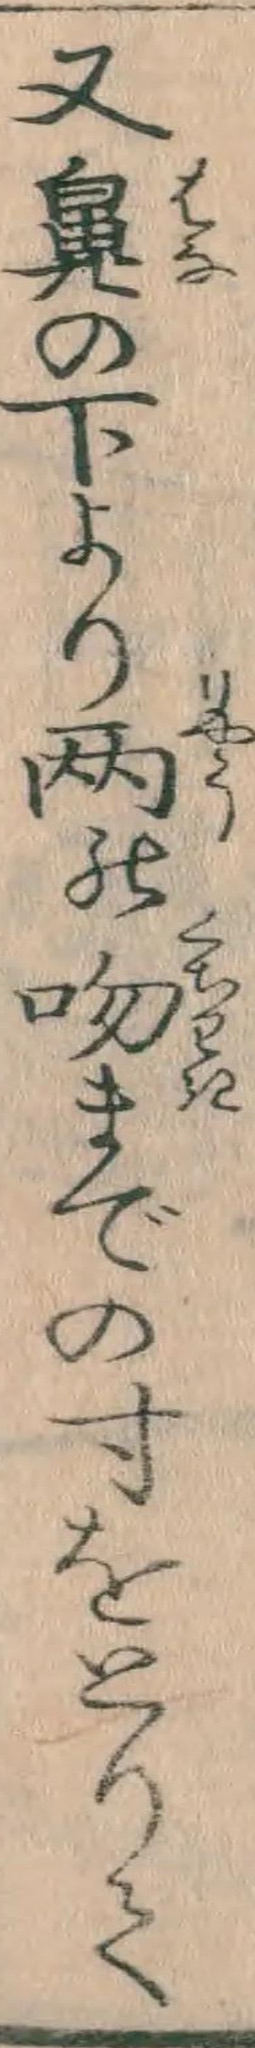又鼻の下より両の吻までの寸をとりて
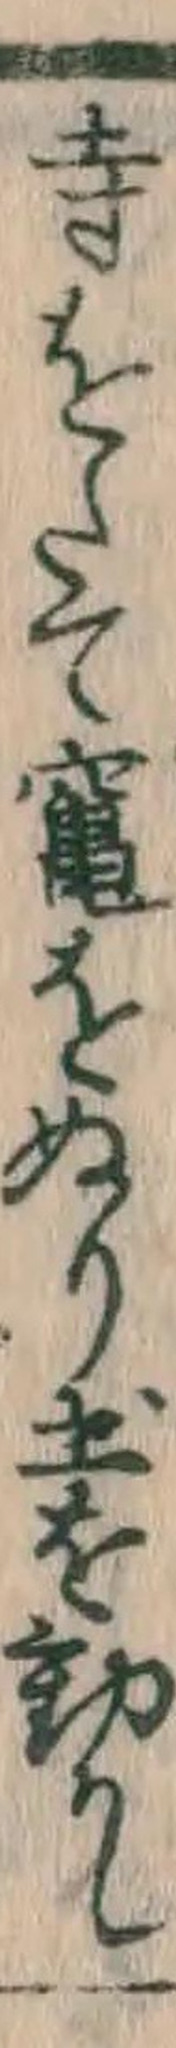寺をたて竈をぬり土を動かし
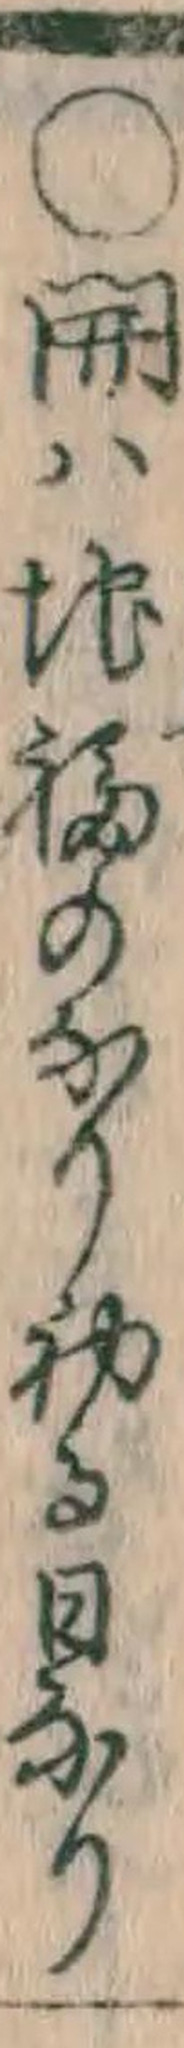○開は地福のなり初る日なり
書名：広益秘事大全 3巻. [4]
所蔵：国立国会図書館 National Diet Library, JAPAN
